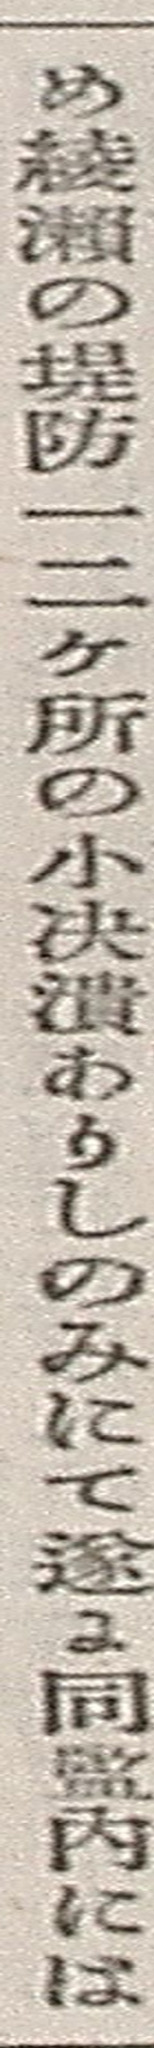め綾瀬の堤防一二ケ所の小決潰ありしのみにて遂に同監内には
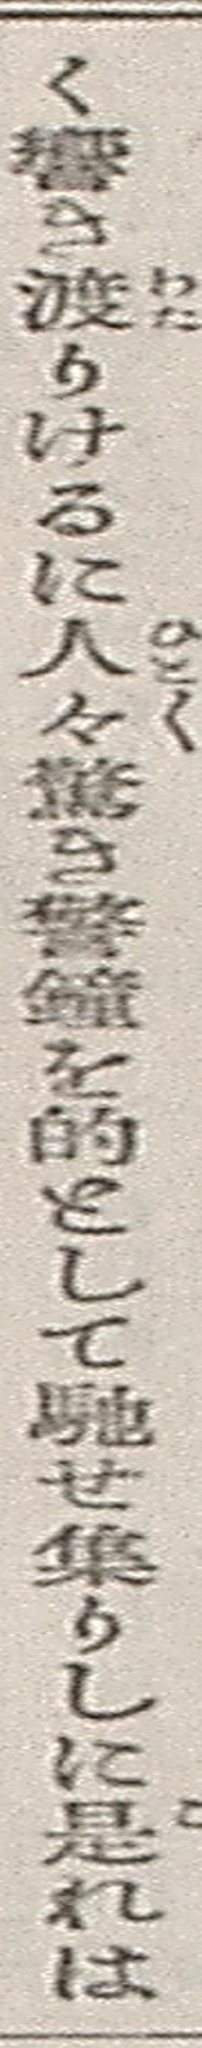く響き渡りけるに人々驚き警鐘を的として馳せ集りしに是れは
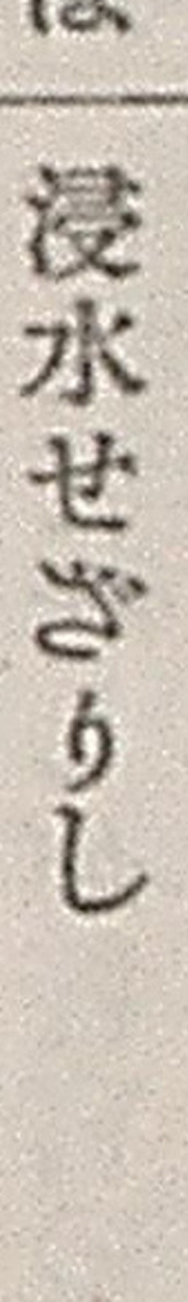浸水せざりし
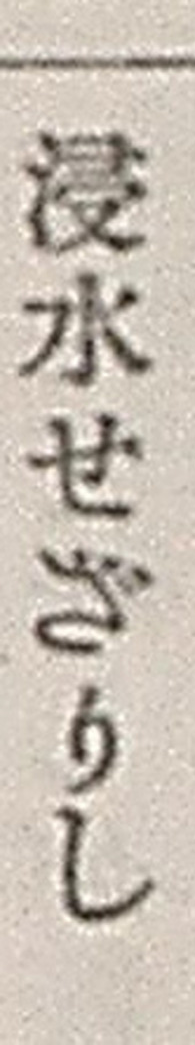浸水せざりし
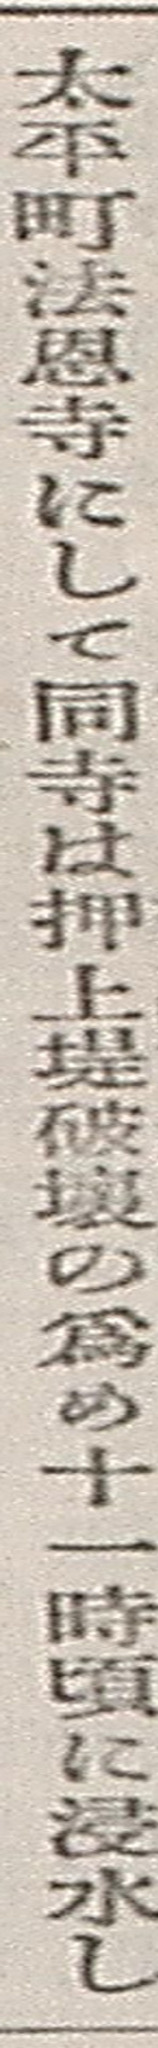太平町法恩寺にして同寺は押上堤破壊の為め十一時頃に浸水し
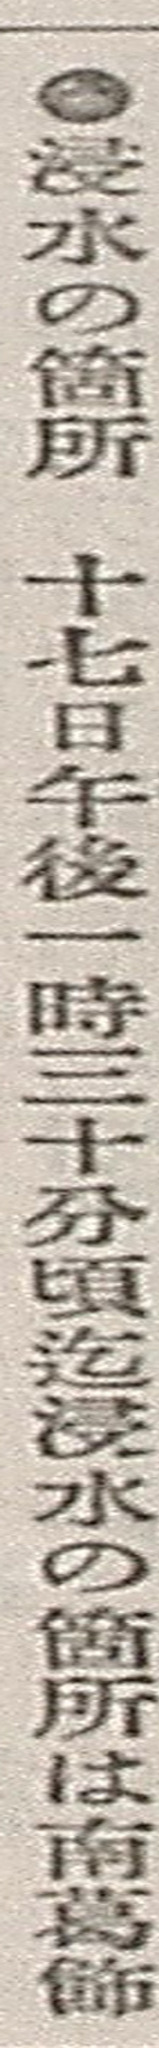●浸水の箇所十七日午後一時三十分頃迄浸水の箇所は南葛飾
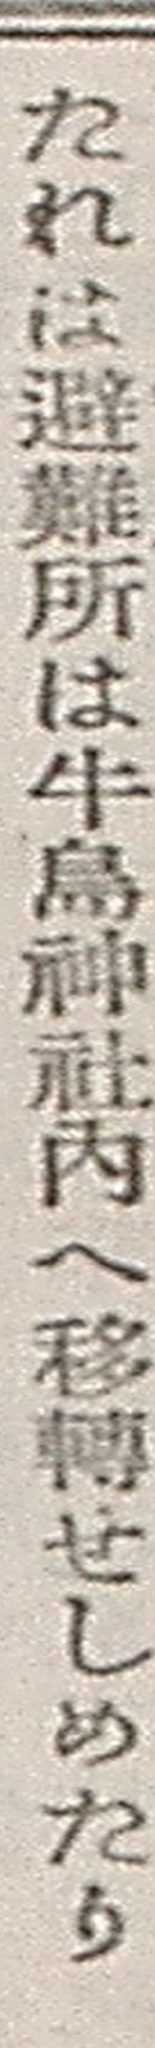たれは避難所は牛島神社内へ移転せしめたり
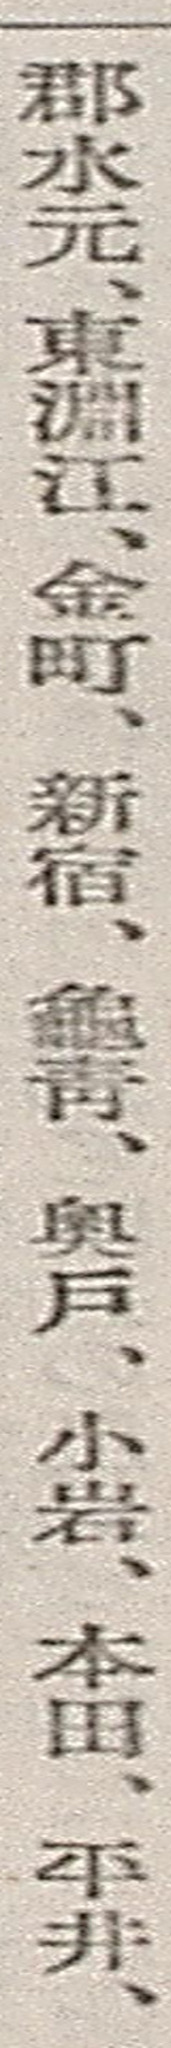郡水元、東淵江、金町、新宿、亀青、奥戸、小岩、本田、平井、
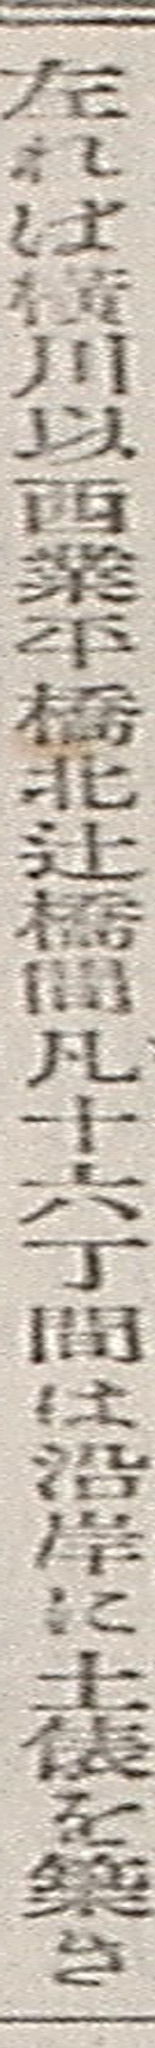左れば横川以西業平橋北辻間凡十六丁間は沿岸に土俵を築き
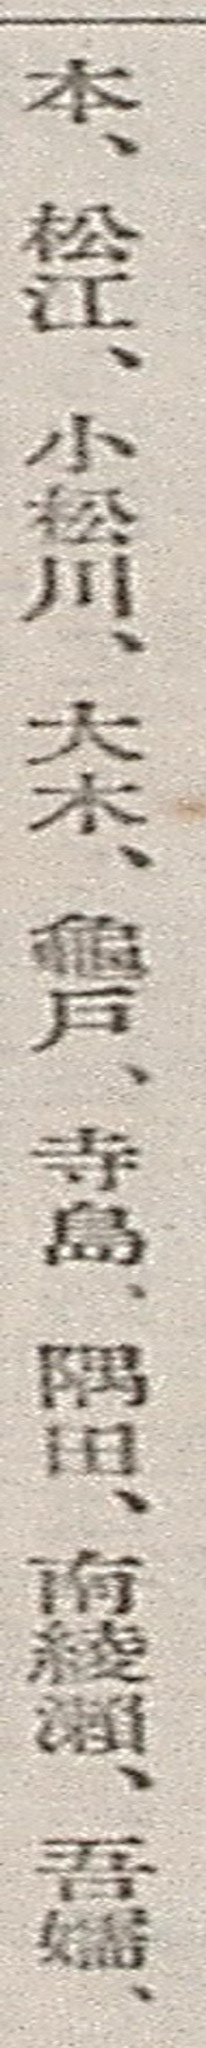本、松江、小松川、大木、亀戸、寺島、隅田、南綾瀬、吾嬬、
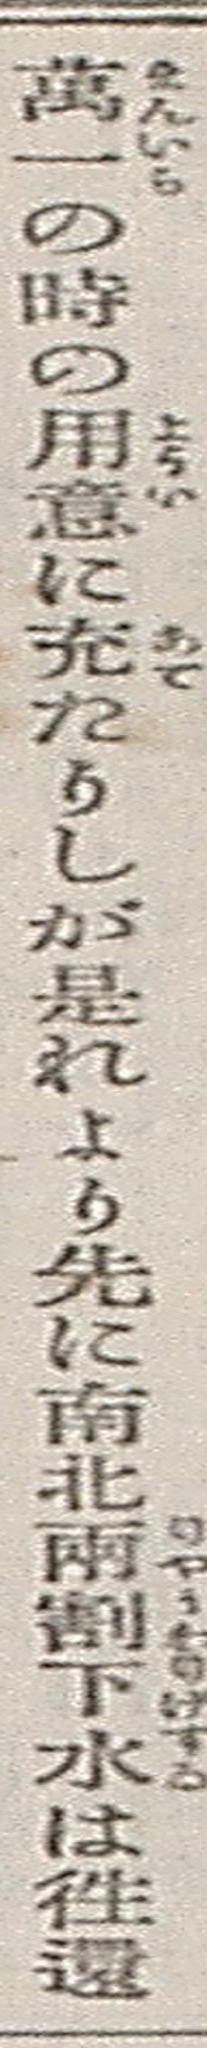万一の時の用意に充たりしが是れより先に南北両割下水は往還
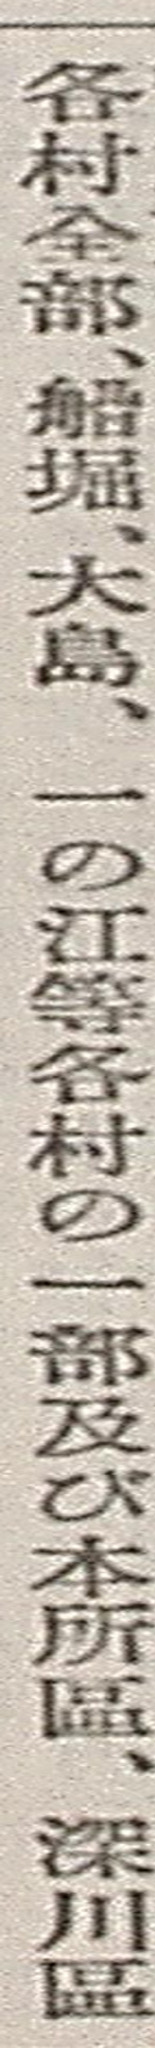各村全部、船堀、大島、一の江等各村の一部及び本所区、深川区
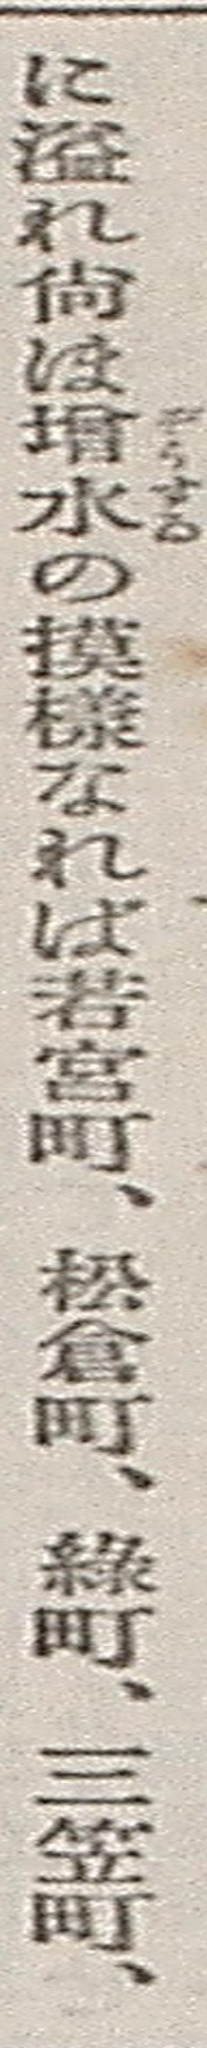に溢れ尚ほ増水の模様なれば若宮町、松倉町、緑町、三笠町、
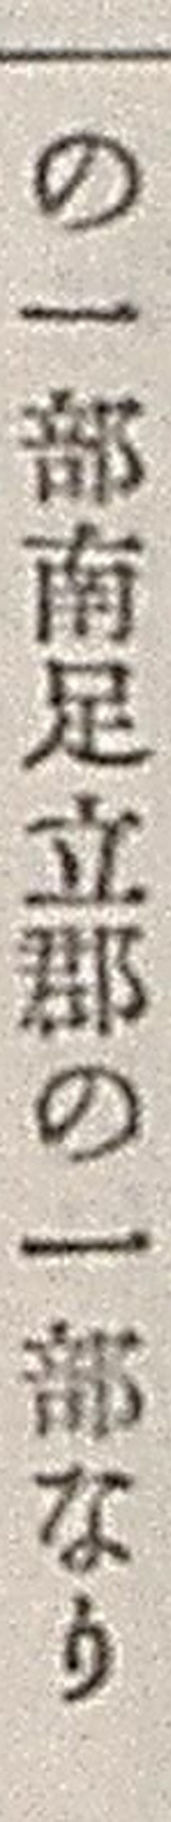の一部南足立郡の一部なり
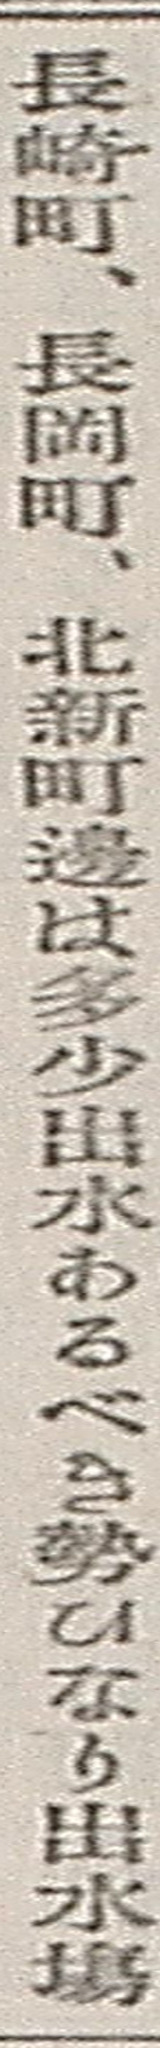長崎町、長岡町、北新町辺は多少出水あるべき勢ひなり出水場
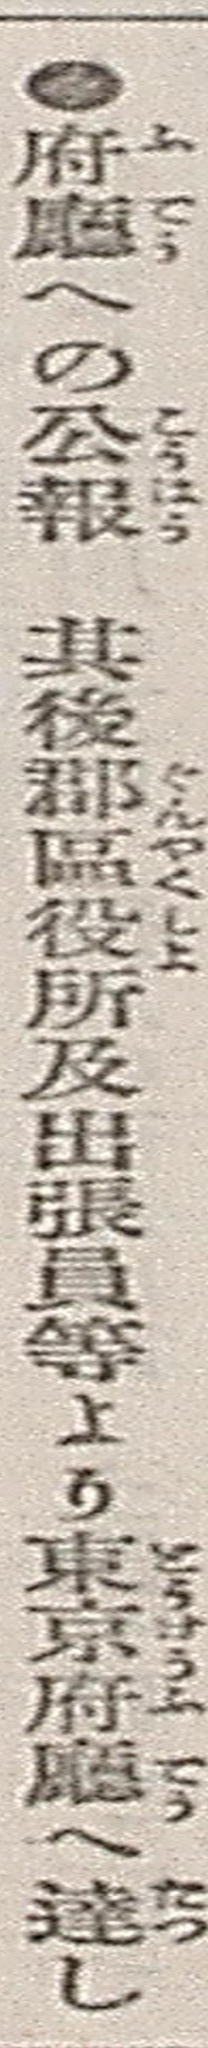●府庁への広報其後郡区役所及出張員等より東京府庁へ達し
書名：風俗畫報臨時増刊第百二十四號　洪水地震被害録（上）
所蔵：東京大学地震研究所図書室 Earthquake Research Institute Library, The University of Tokyo, JAPAN
